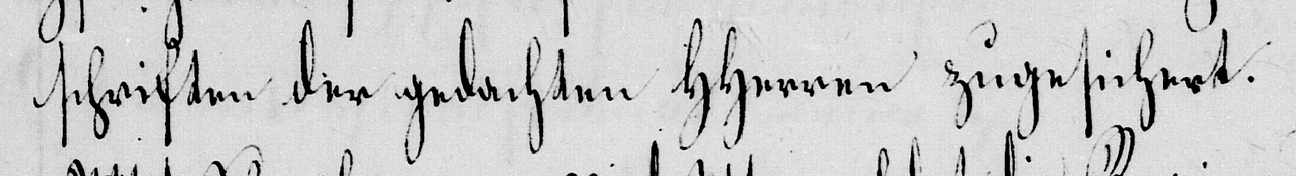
schriften der gedachten HHerren zugesichert.
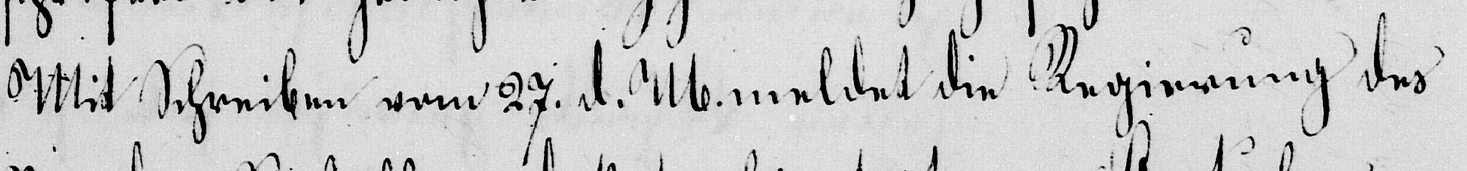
Mit Schreiben vom 27. d. M. meldet die Regierung des
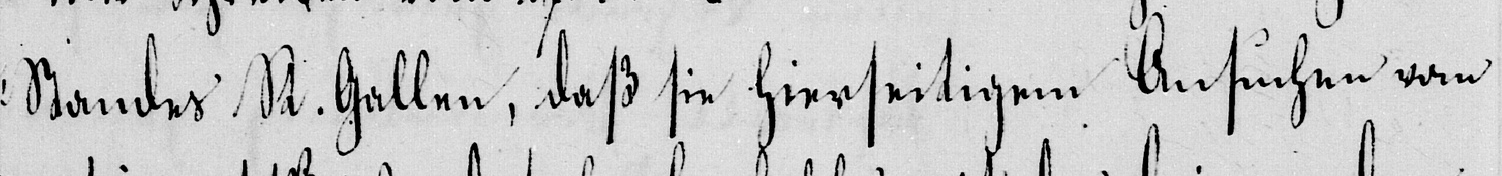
Standes St. Gallen, daß sie hierseitigem Ansuchen vom
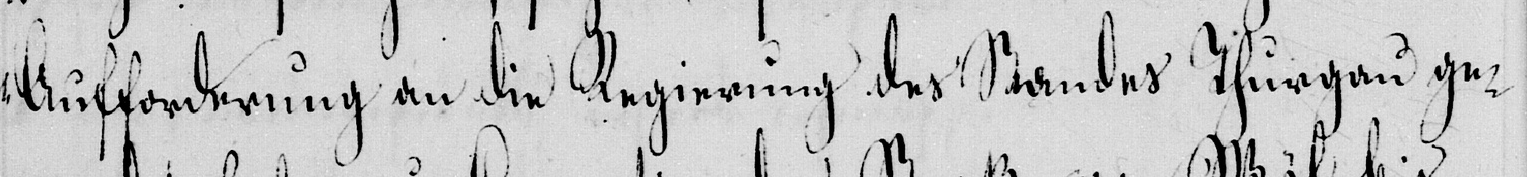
Aufforderung an die Regierung des Standes Thurgau ge¬
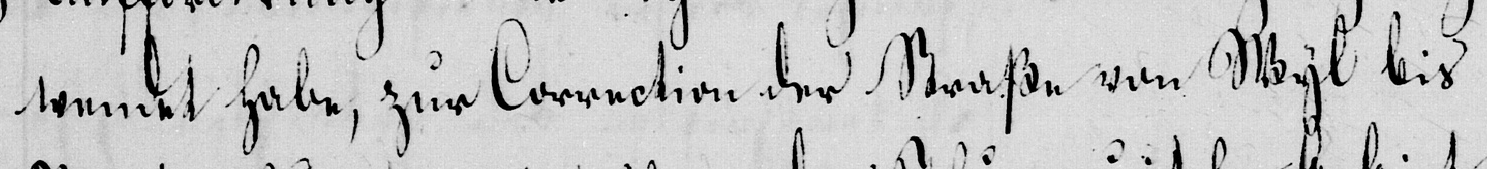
wendet habe, zur Correction der Straße von Wyl bis
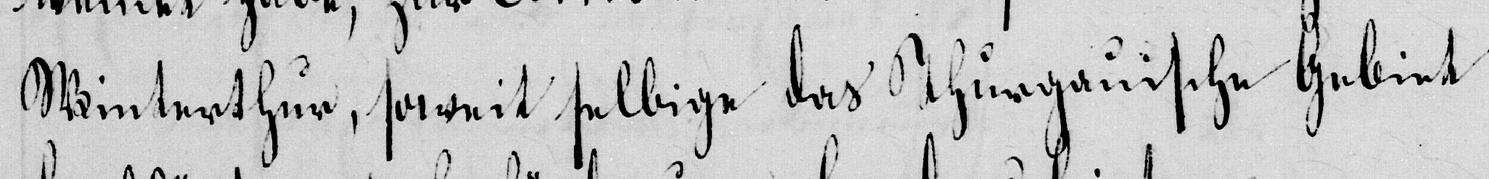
Winterthur, soweit selbiges das Thurgauische Gebiet
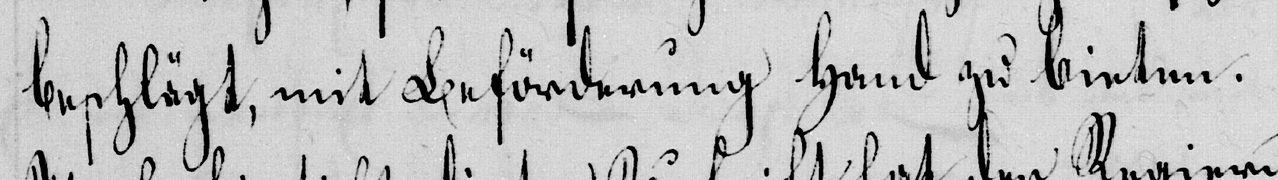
beschlägt, mit Beförderung Hand zu bieten.
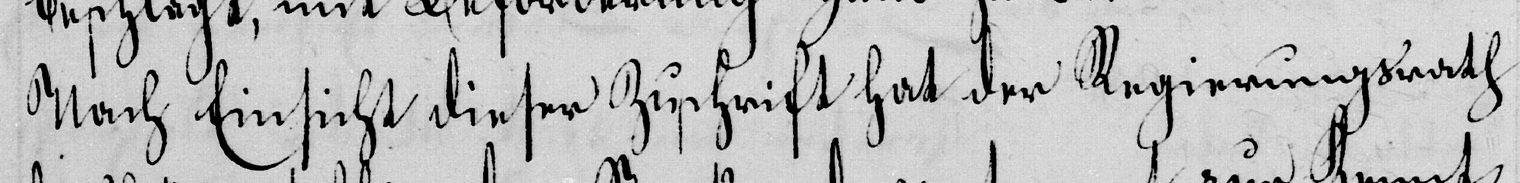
Nach Einsicht dieser Zuschrift hat der Regierungsrath
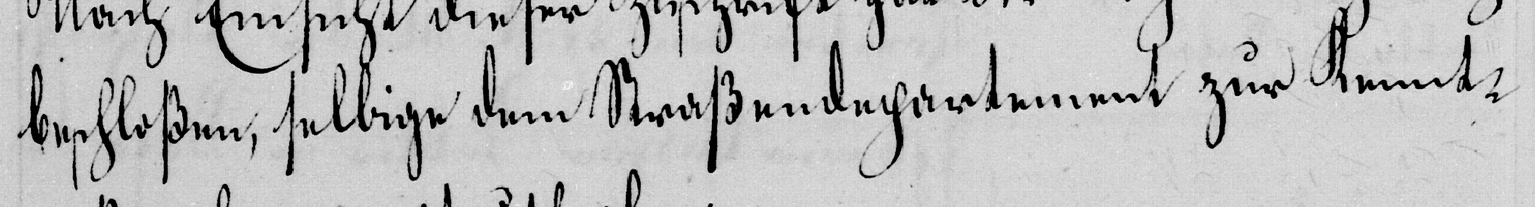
beschloßen, selbige dem Straßendepartement zur Kennt¬
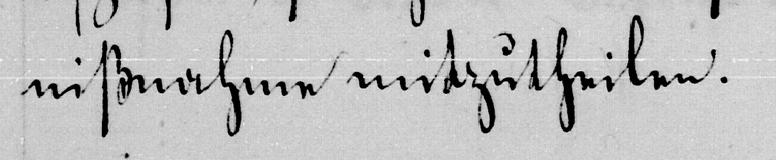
nißnahme mitzutheilen.
